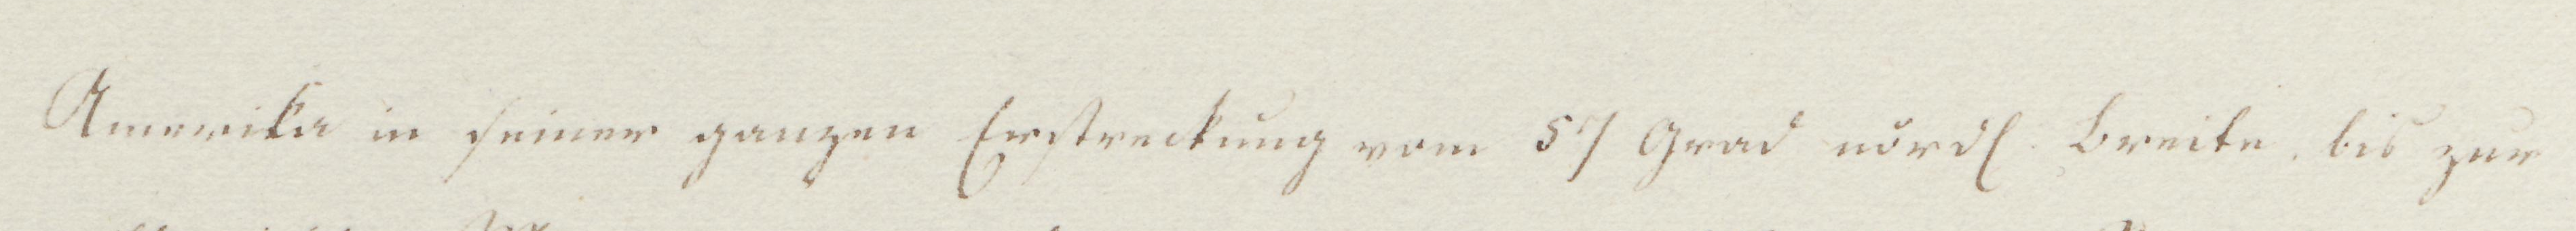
Amerika in seiner ganzen Erstreckung von 57 Grad nördl. Breite, bis zur
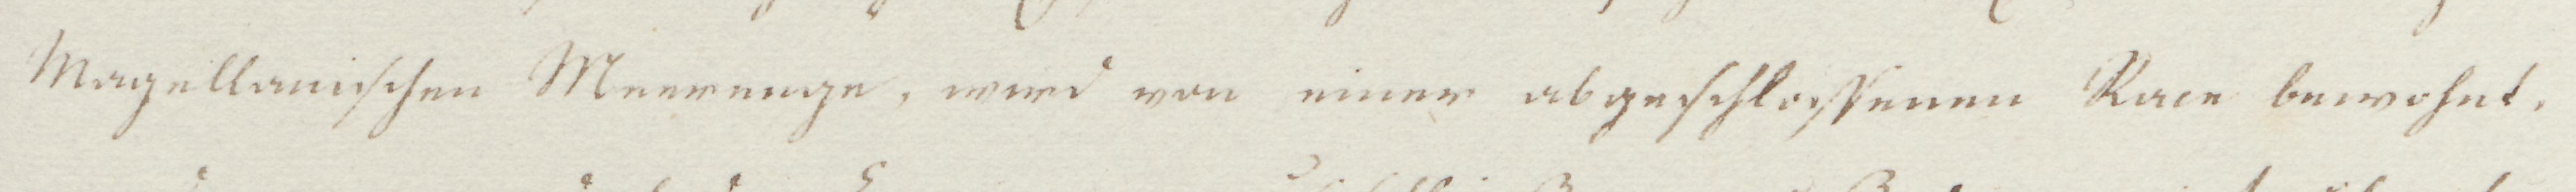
Magellanischen Meerenge, wird von einer abgeschlossenen Race bewohnt,
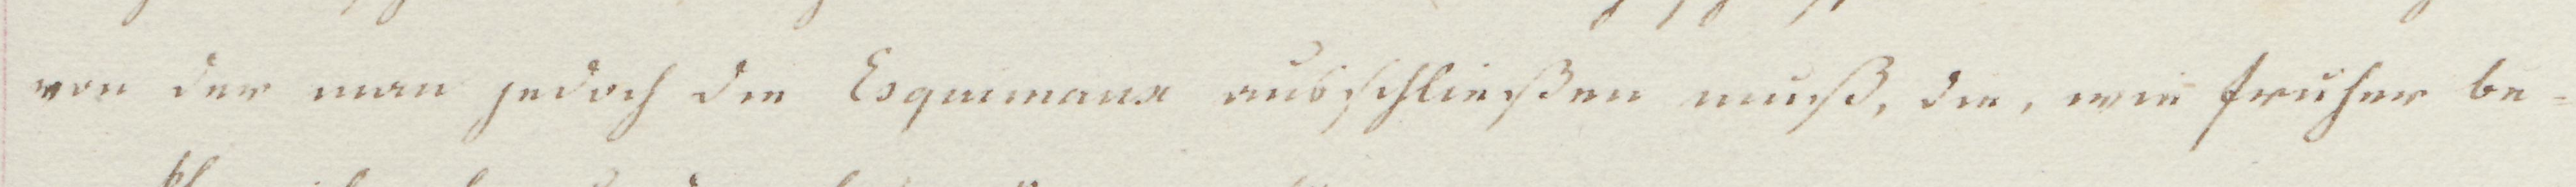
von der man jedoch die Esquimaux ausschließen muß, die, wie früher be-
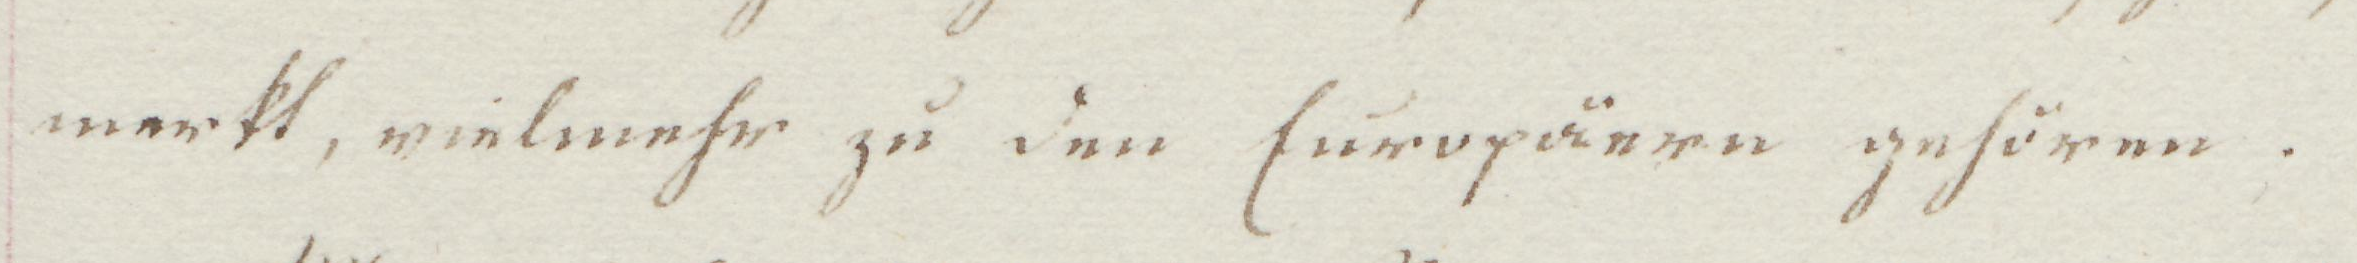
merkt, vielmehr zu den Europäern gehören.
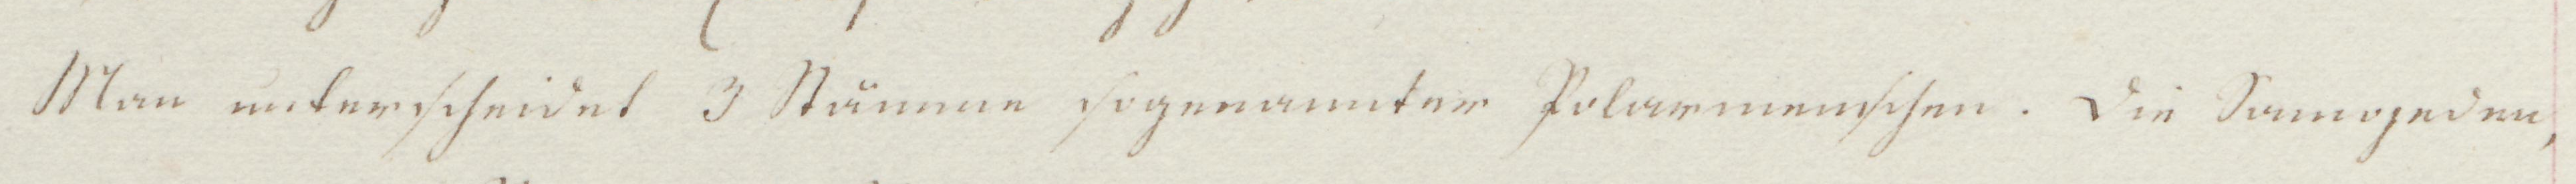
Man unterscheidet 3 Stämme sogenannter Polarmenschen. Die Samojeden,
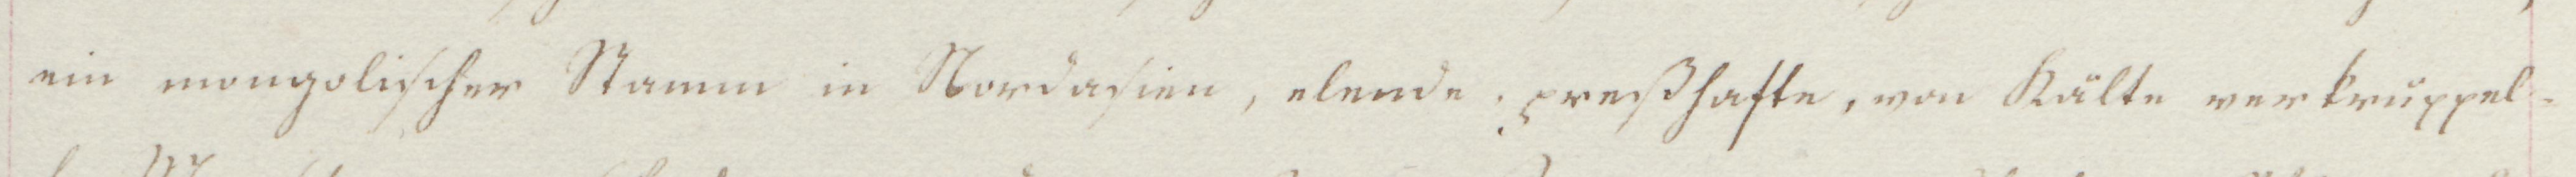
ein mongolischer Stamm in Nordasien, elende, preßhafte, von Kälte verkrüppel-
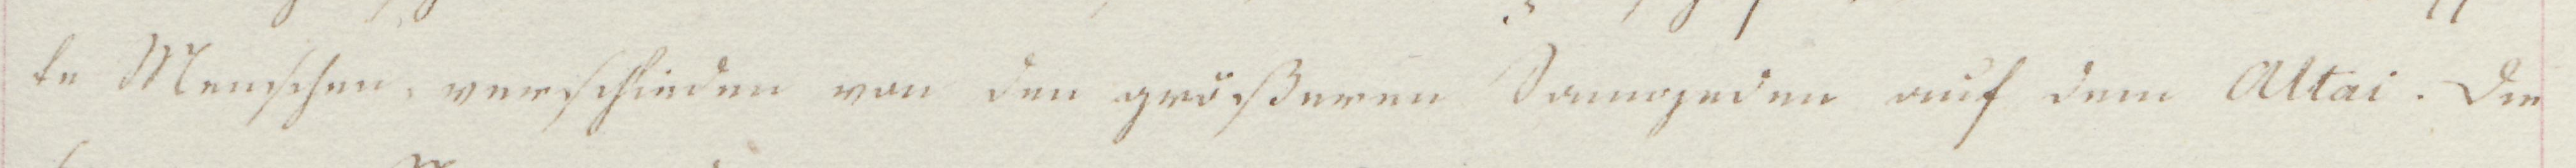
te Menschen, verschieden von den größeren Samojeden auf dem Altai. Die
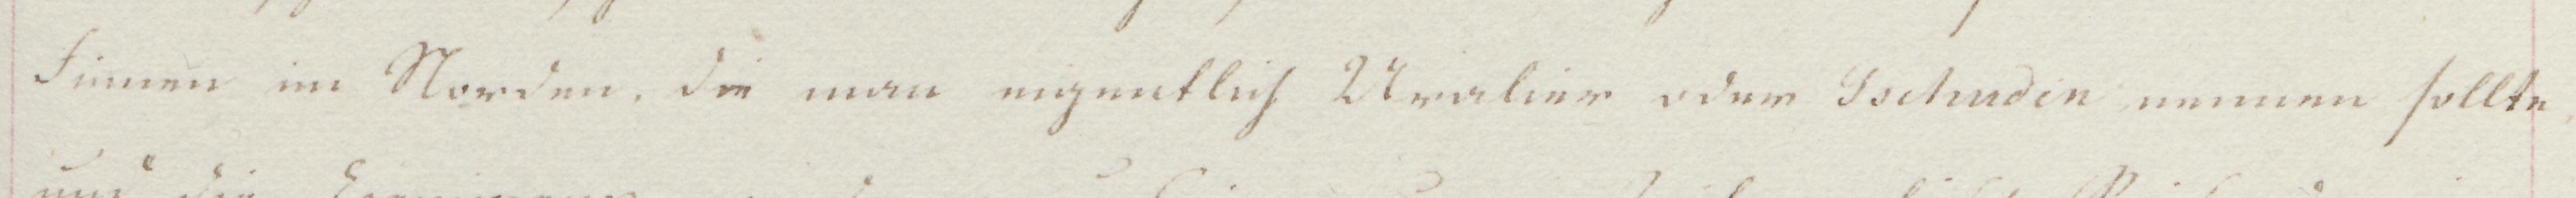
Finnen im Norden, die man eigentlich Uralier oder Tschuden nennen sollte,
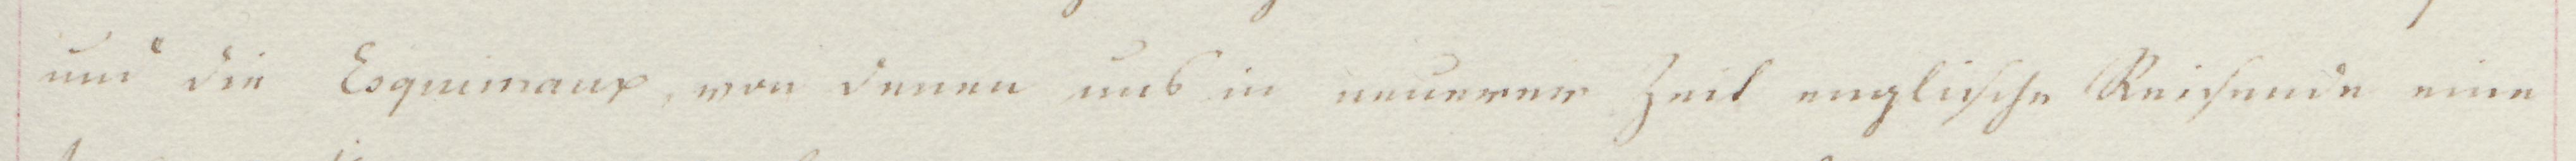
und die Esquimaux, von denen uns in neuerer Zeit englische Reisende eine
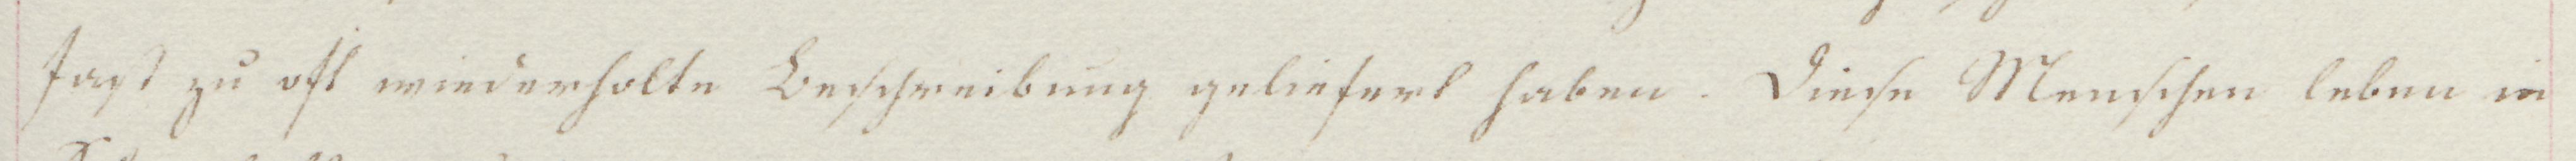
fast zu oft wiederholte Beschreibung geliefert haben. Diese Menschen leben in
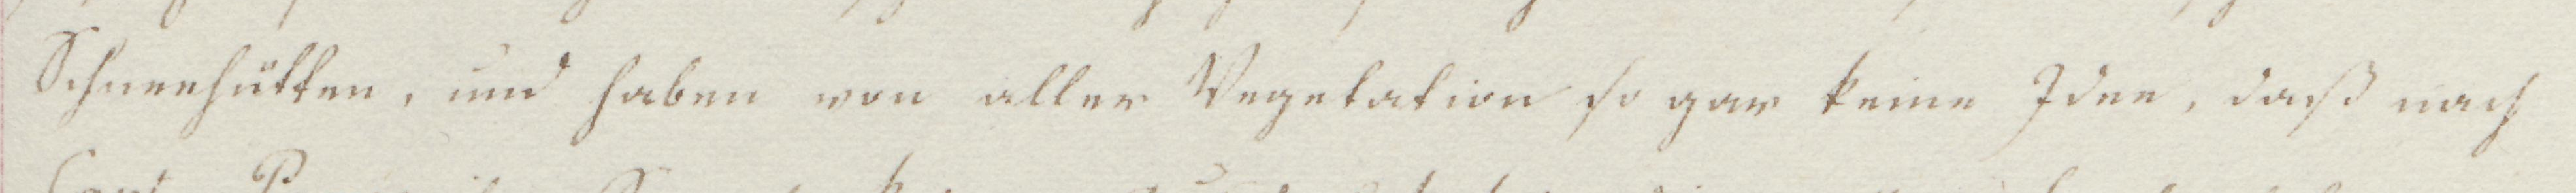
Schneehütten, und haben von aller Vegetation so gar keine Idee, daß nach
